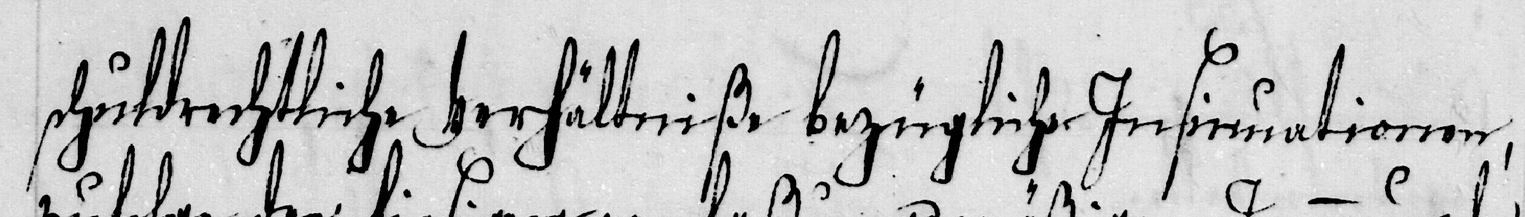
schriftliche Verhältniße bezüglich Insinuationen,
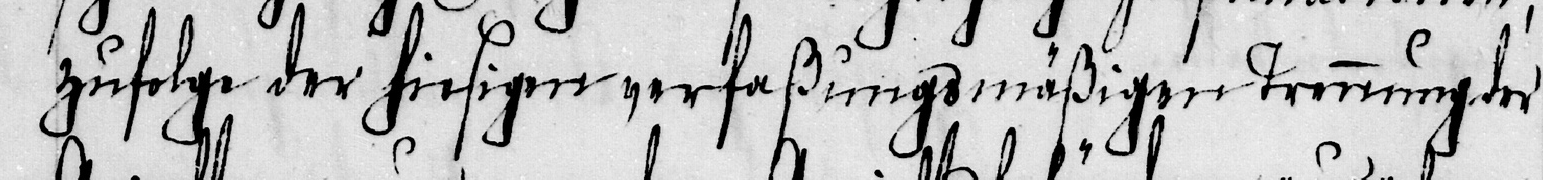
zufolge der hiesigen verfaßungsmäßigen Trennung der
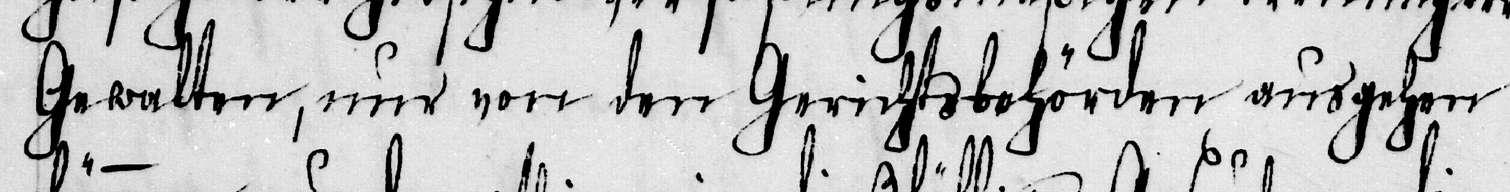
Gewalten, nur von den Gerichtsbehörden ausgehen
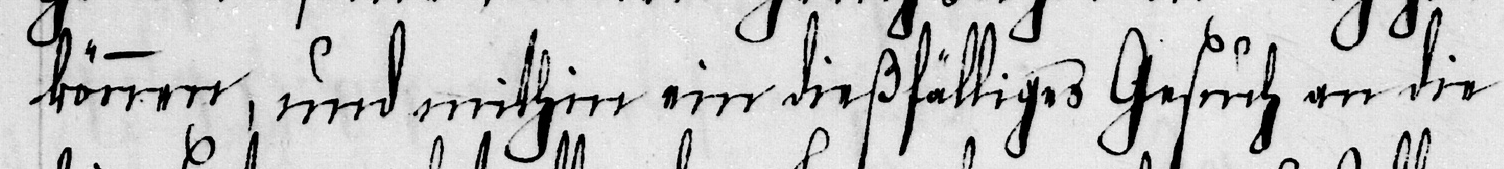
können, und mithin ein dießfälliges Gesuch an die
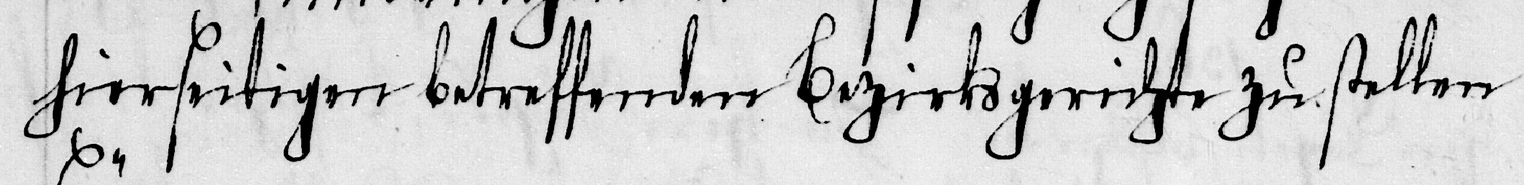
hierseitigen betreffenden Bezirksgerichte zu stellen
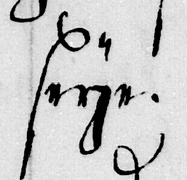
seye.
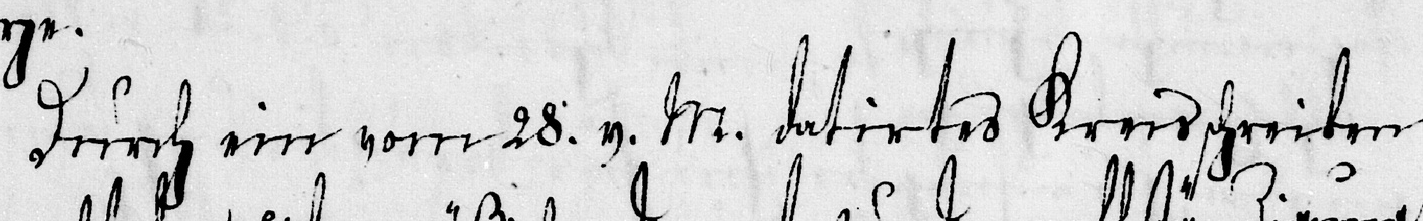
Durch ein vom 28. v. M. datirtes Kreisschreiben
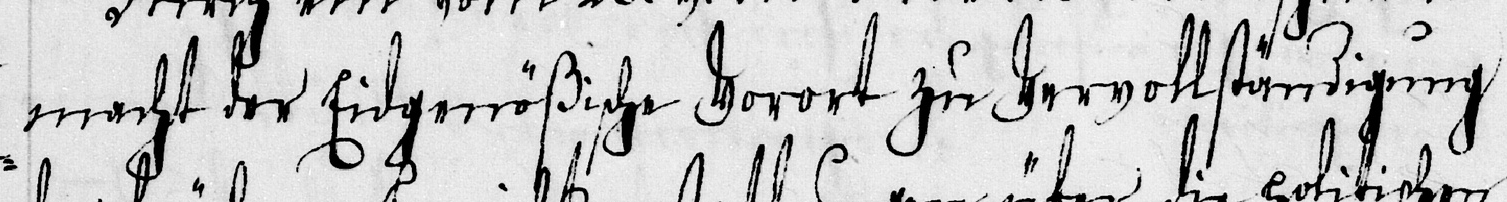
macht der Eidgenößische Vorort zu Vervollständigung
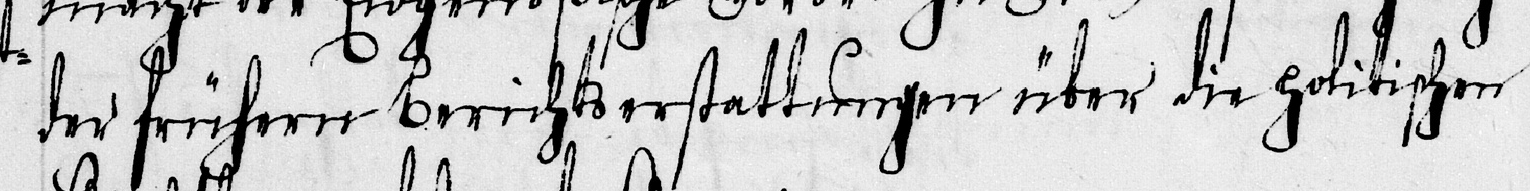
der frühern Berichtserstattungen über die politischen
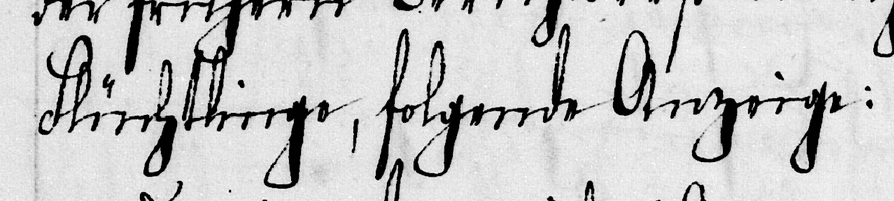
Flüchtlinge, folgende Anzeige:
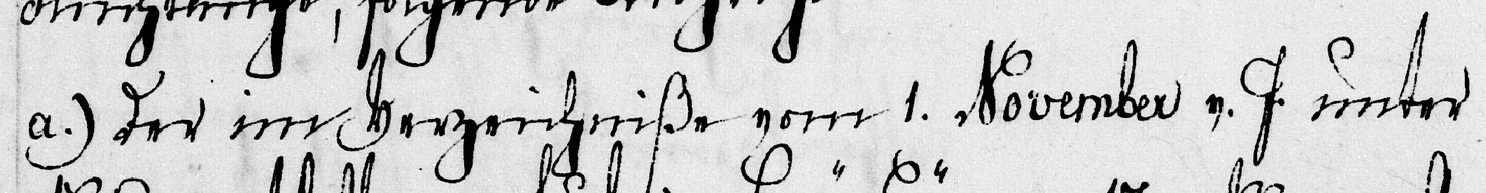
a.) Der im Verzeichniße vom 1. November v. J. unter
